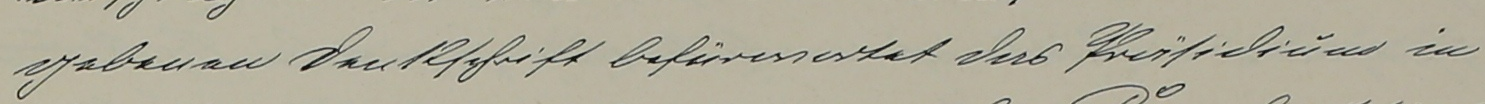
gebenen Denkschrift befürwortet das Präsidium in
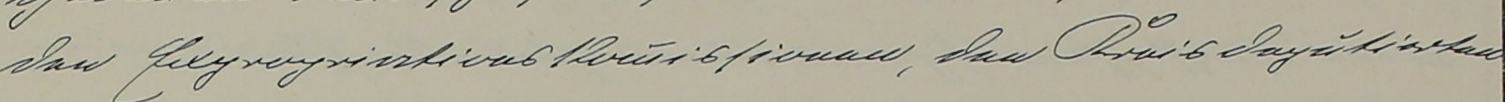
den Expropriationskommissionen, den Kreisdeputierten
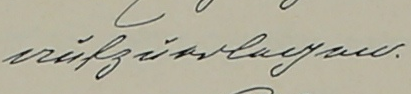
aufzuerlegen.
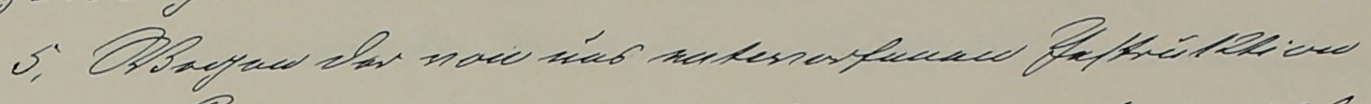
5. Wegen der von uns entworfenen Instruktion
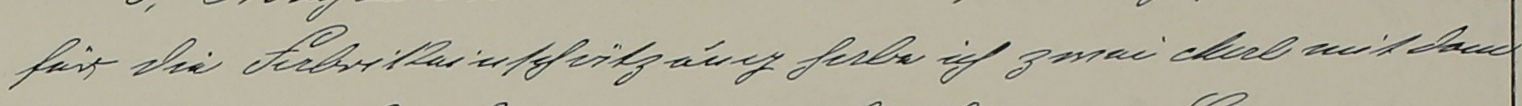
für die Fabrikeinschätzung habe ich zwei Mal mit dem
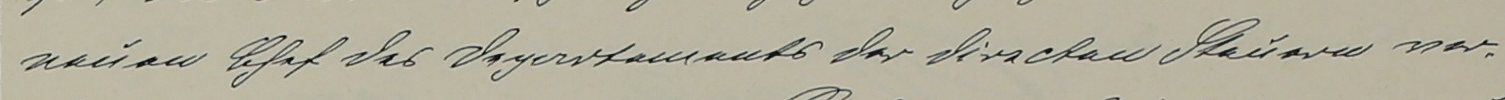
neuen Chef des Departements der directen Steuern ver-
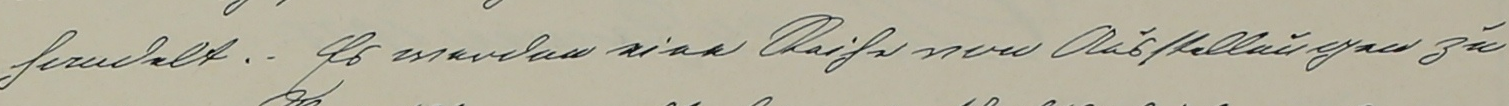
handelt. - Es werden eine Reihe von Ausstellungen zu
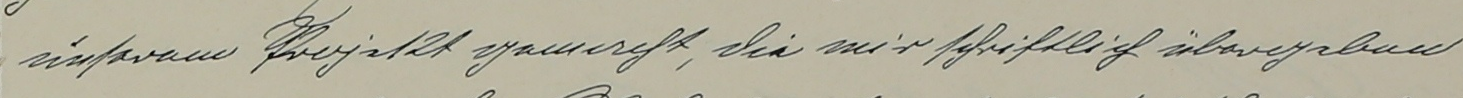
unserem Projekt gemacht, die mir schriftlich übergeben
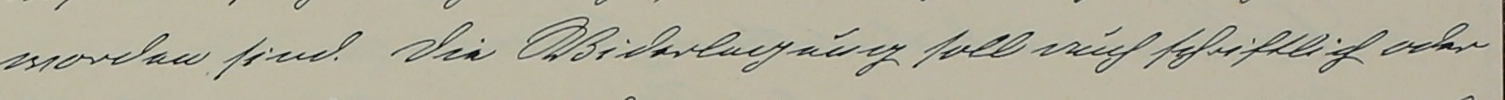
worden sind. Die Widerlegung soll auch schriftlich oder
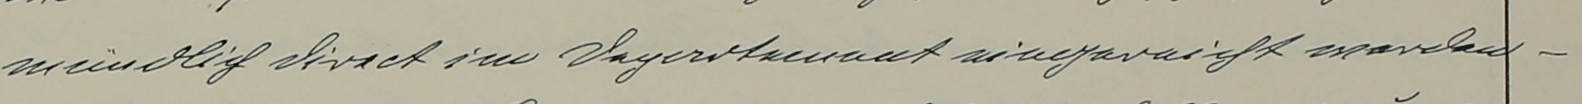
mündlich direct im Departement eingereicht werden –
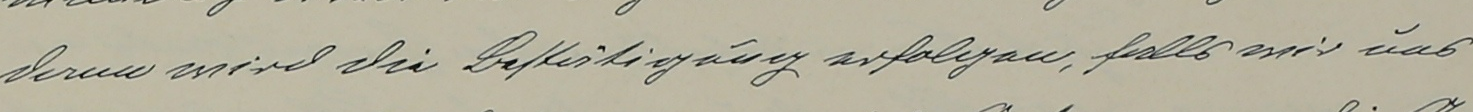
dann wird die Bestätigung erfolgen, falls wir uns
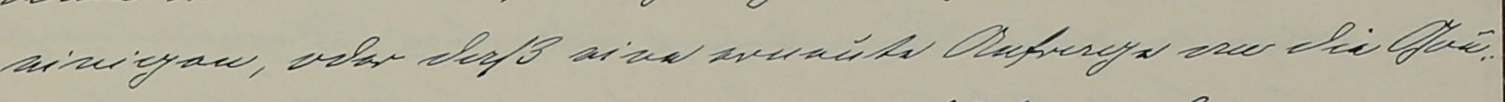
einigen, oder daß eine erneute Anfrage an die Gou-
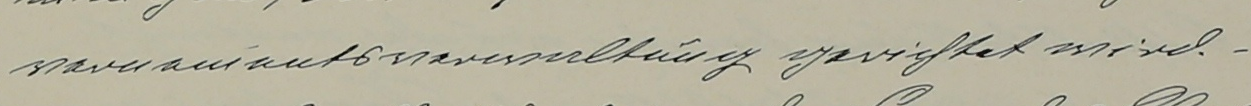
vernementsverwaltung gerichtet wird.
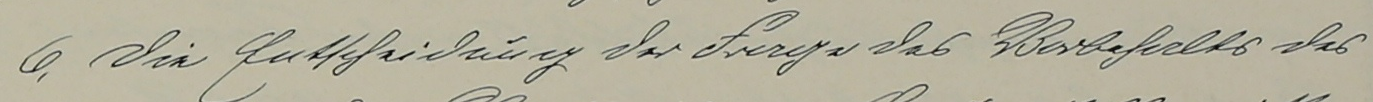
6. Die Entscheidung der Frage des Vorbehalts des
